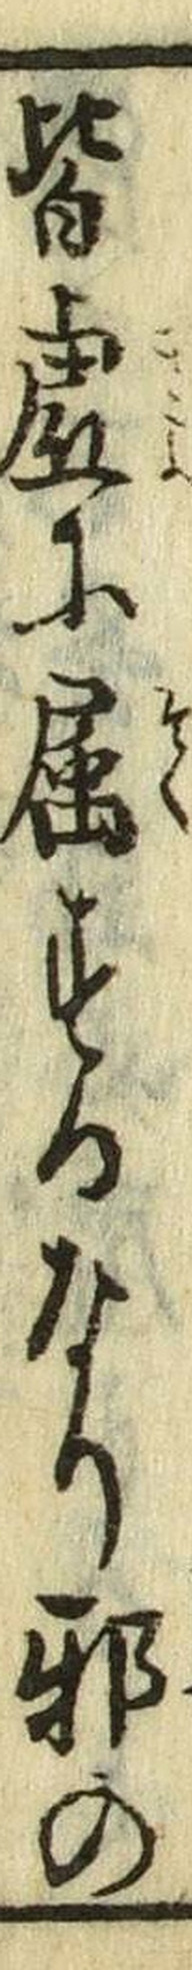皆虚に属するなり邪の

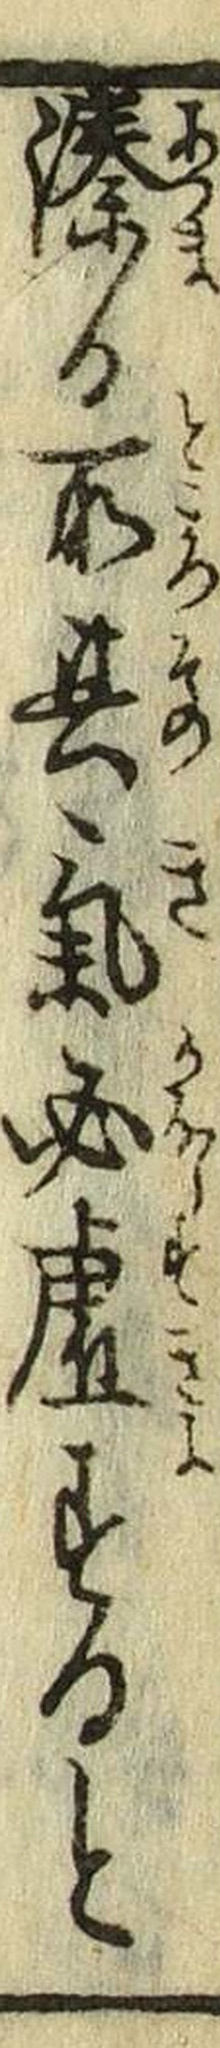湊る所其気必虚すると
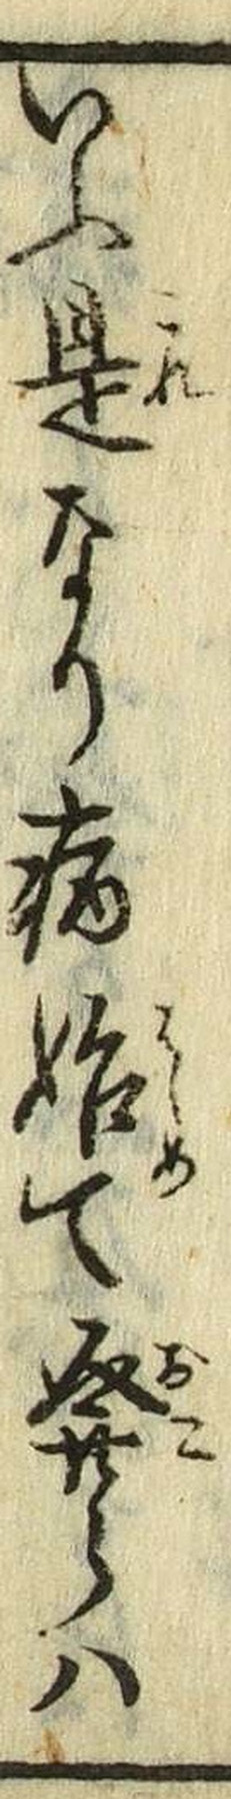いふ是なり病始て発らは
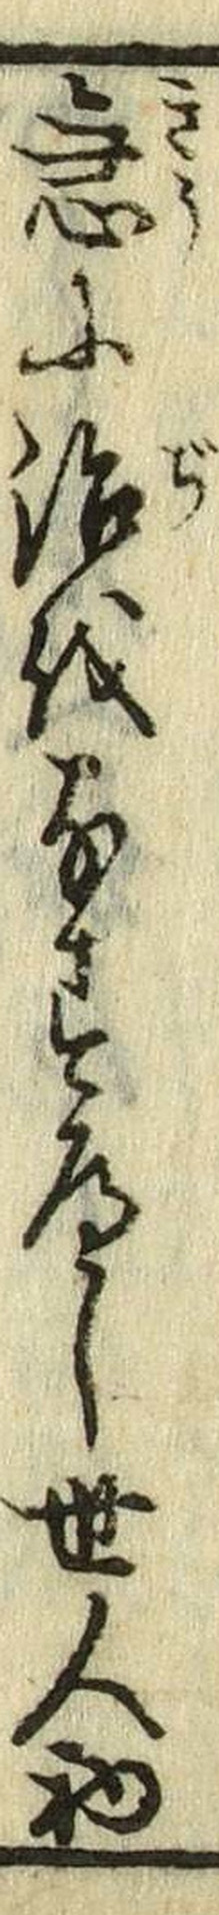急に治をなすへし世人初
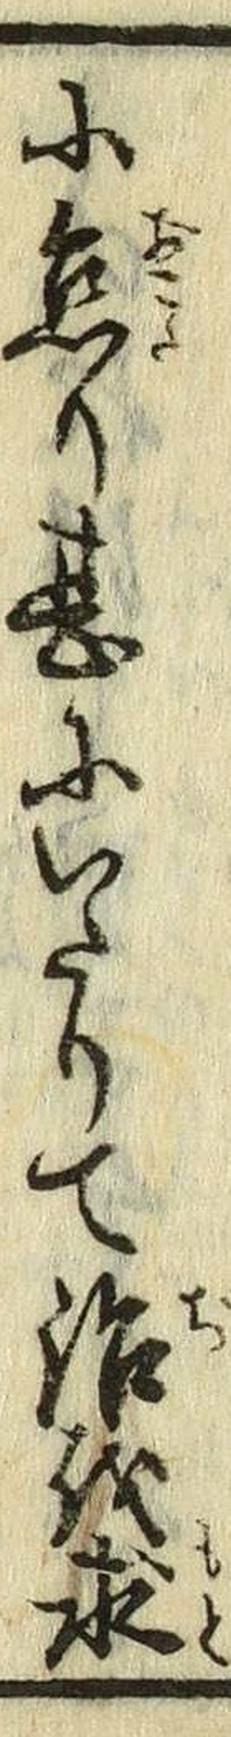に怠り甚にいたりて治を求
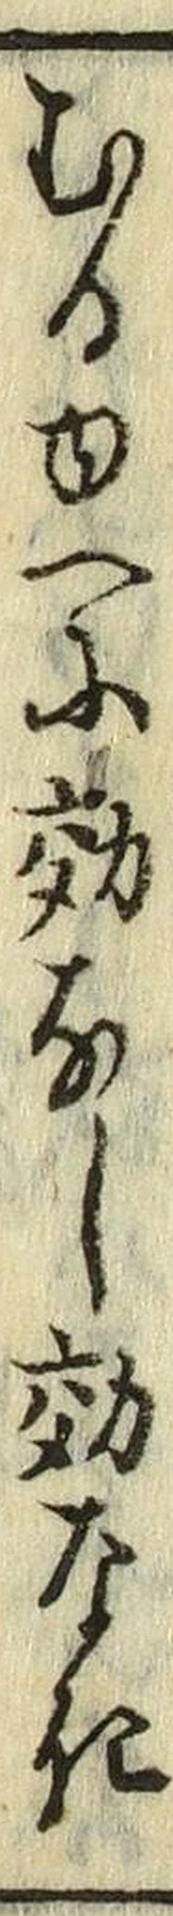むるゆへに効なし効なき
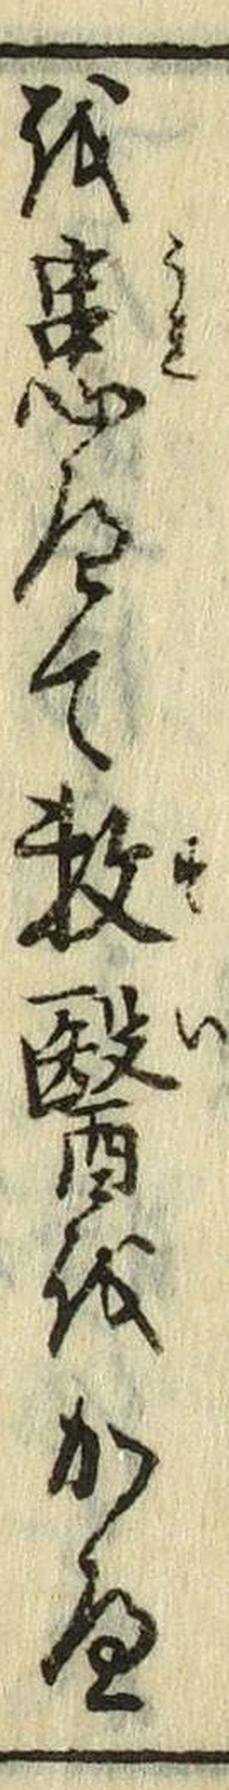を患へて数医をかへ
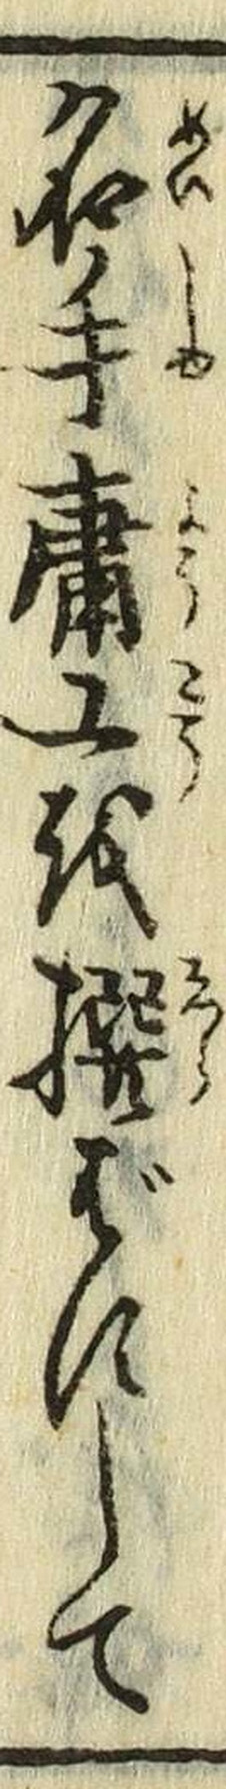名手膺工を撰ばすして
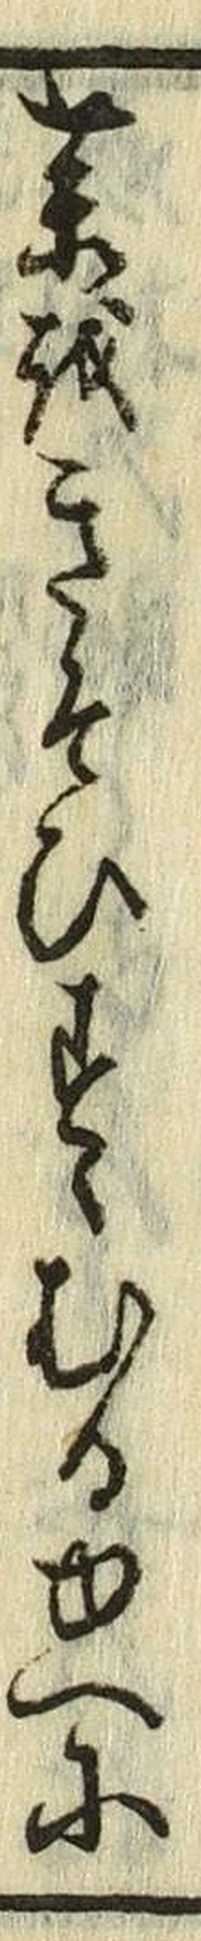薬をきそひすゝむるゆへに
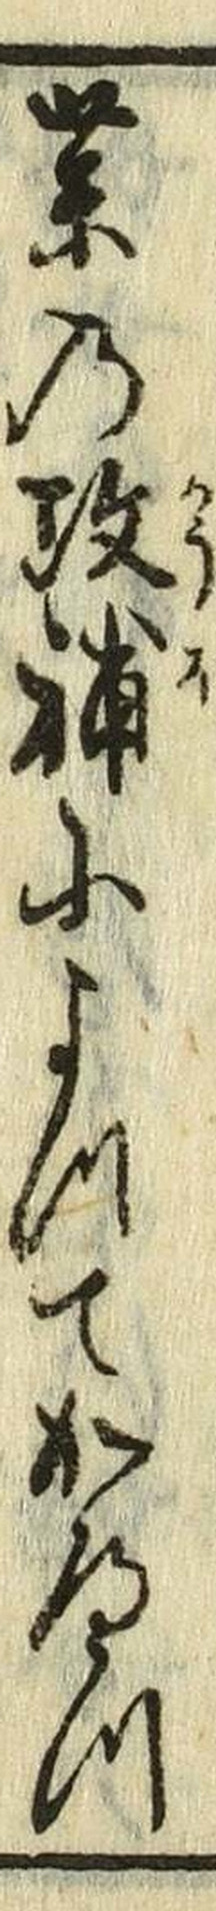薬の攻補によつてかへつ
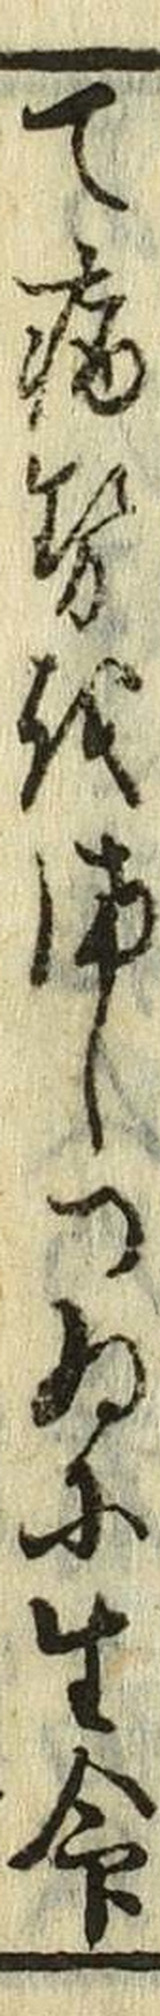て病勢をましつゐに生命
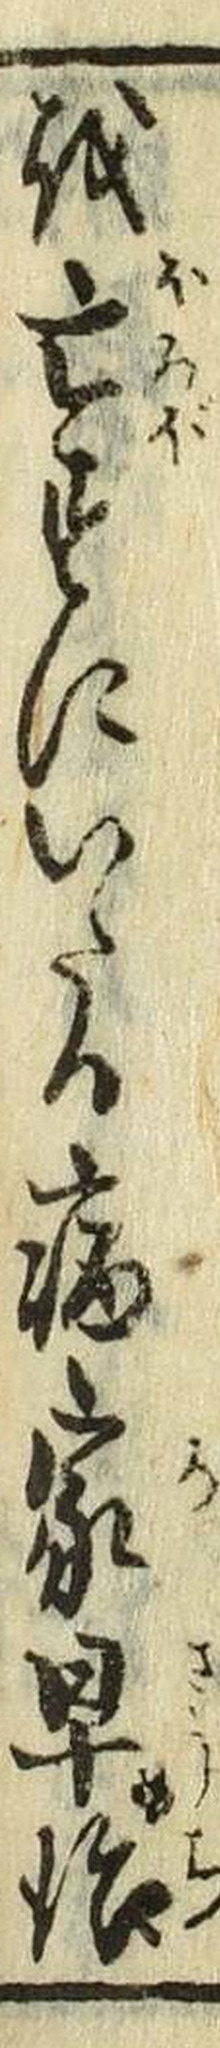を亡すにいたる病家早治
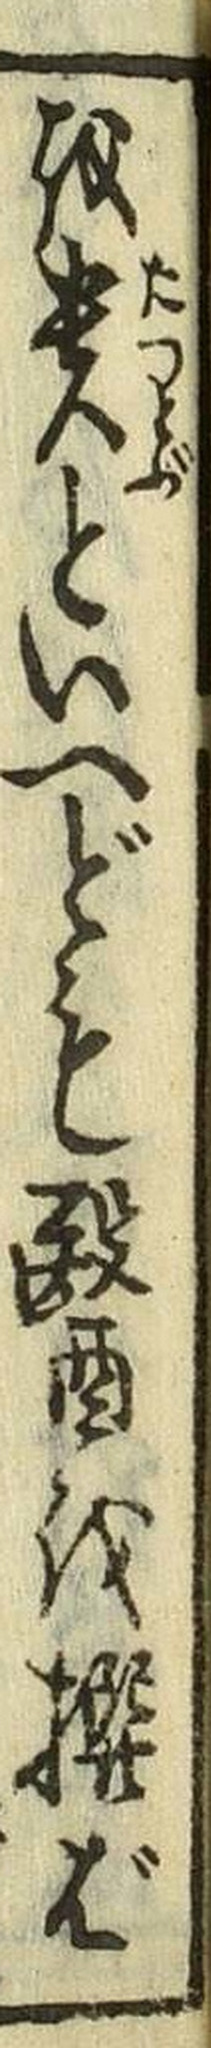を貴といへども医を撰ば
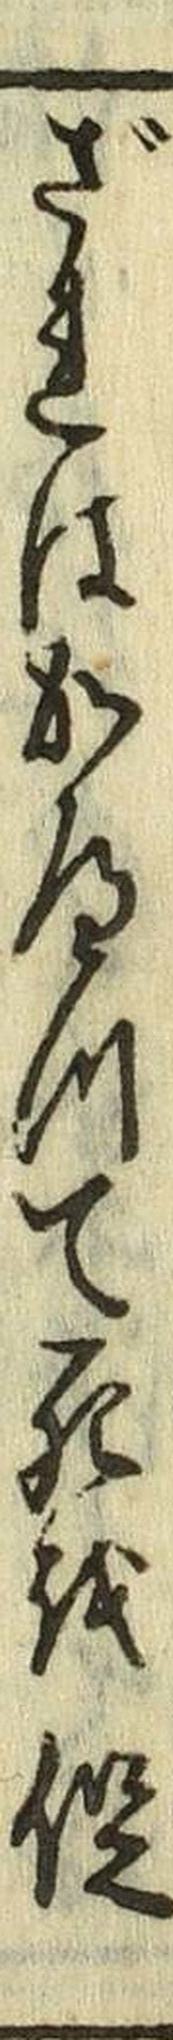ざれはかへつて死を促
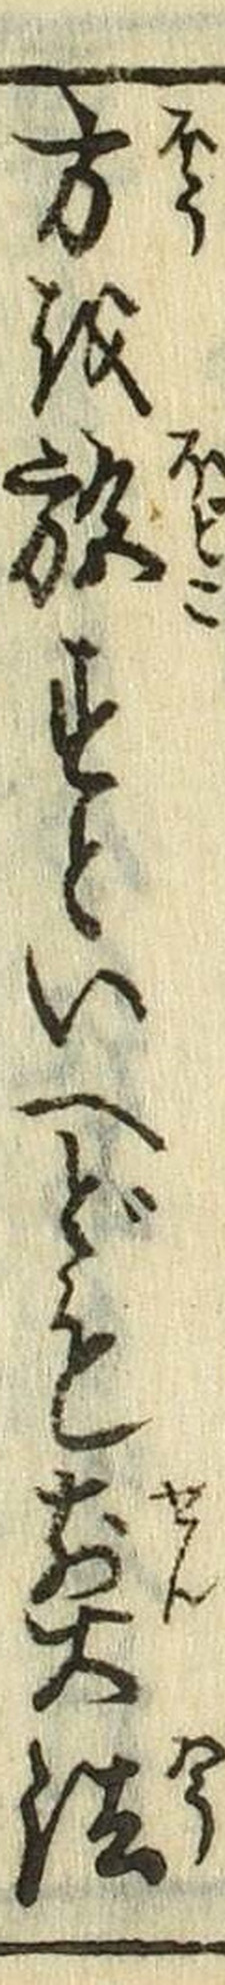方を施すといへども煎法
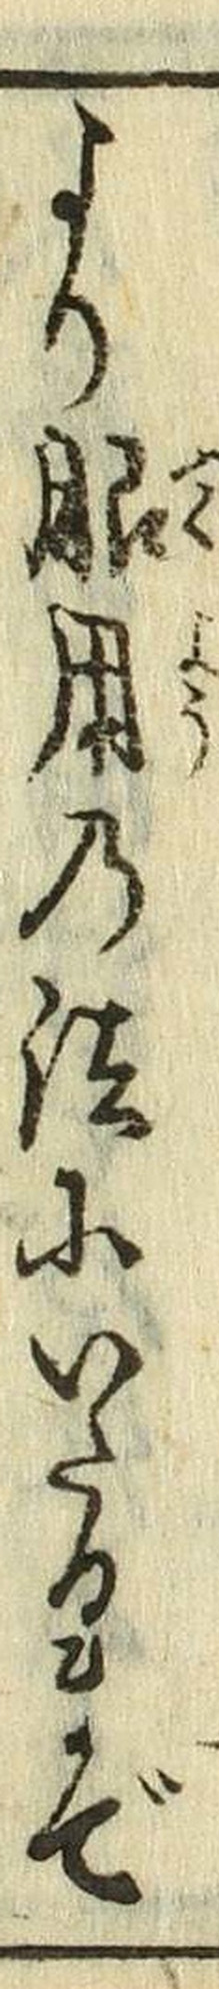より服用の法にいたるまで
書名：居家養生記
